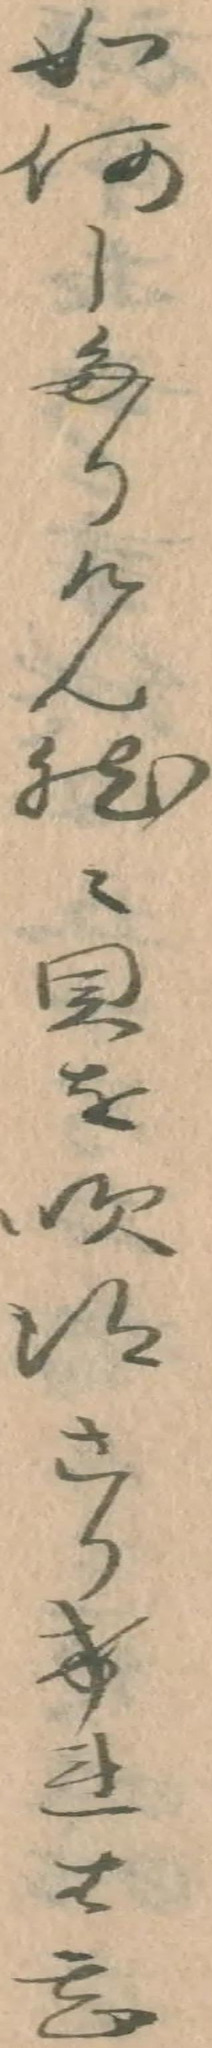如何し多りけん然に貝を吹得さり希連者甚
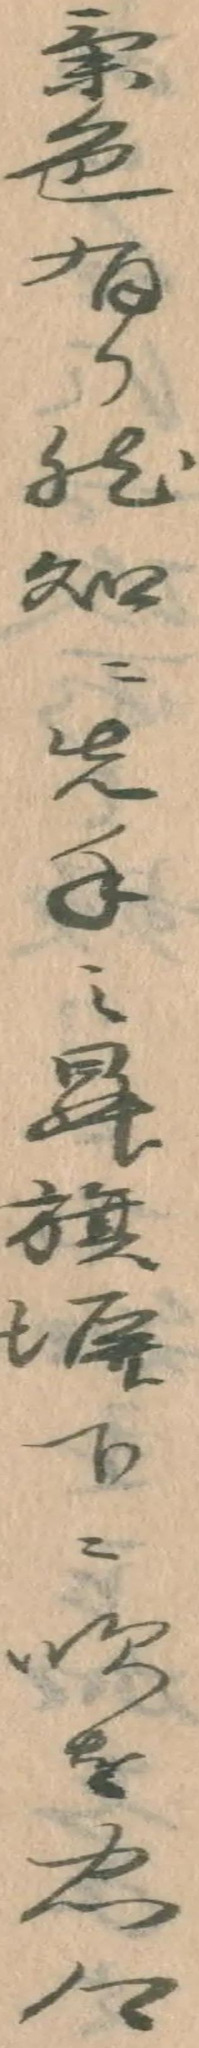気色有り然処に先手之昇旗塀下に吹を忠郷
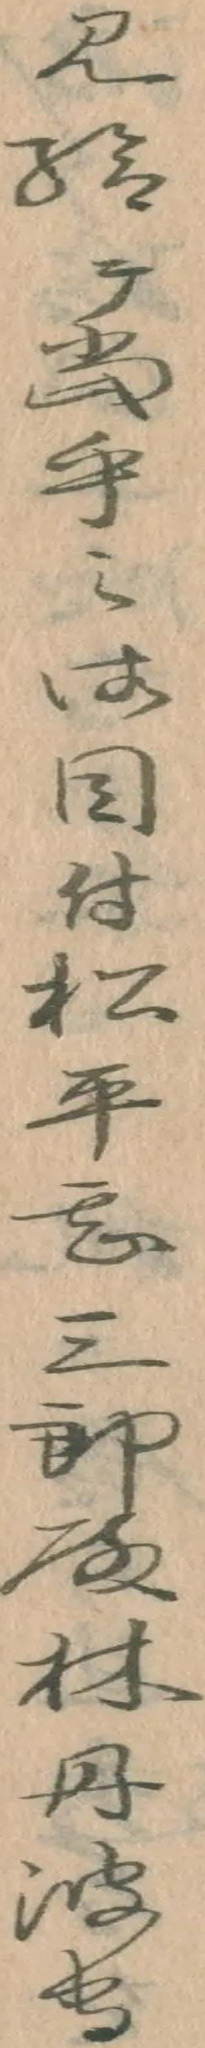見給て当乎之御目付松平甚三郎殿林丹波守
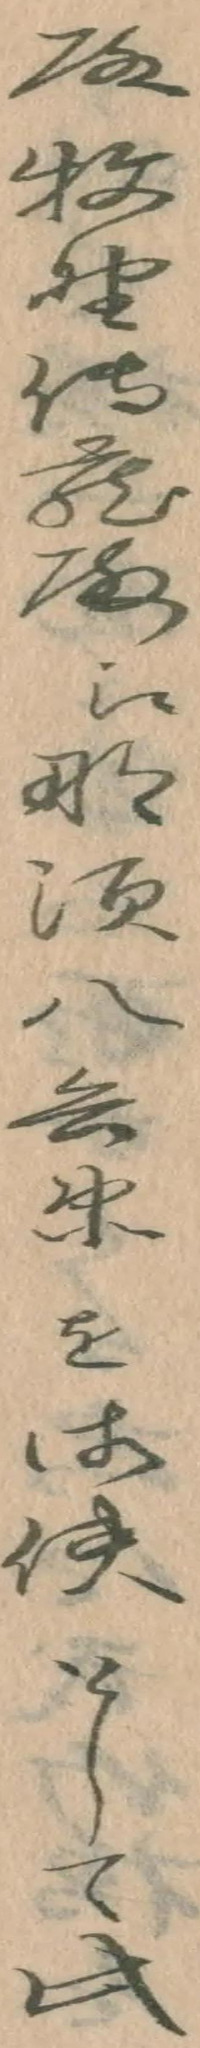殿牧野伝蔵殿江那須八兵衛を御使として此
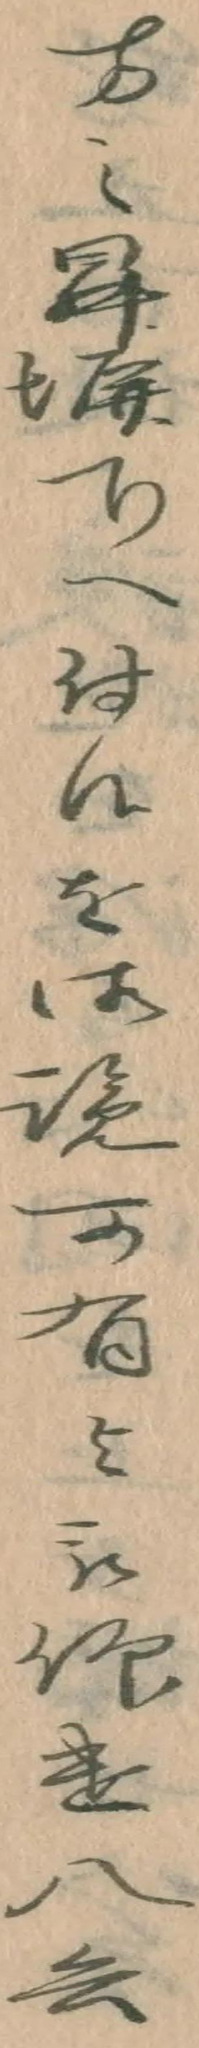方之昇塀下へ付候を御覧可有与被仰遣八兵
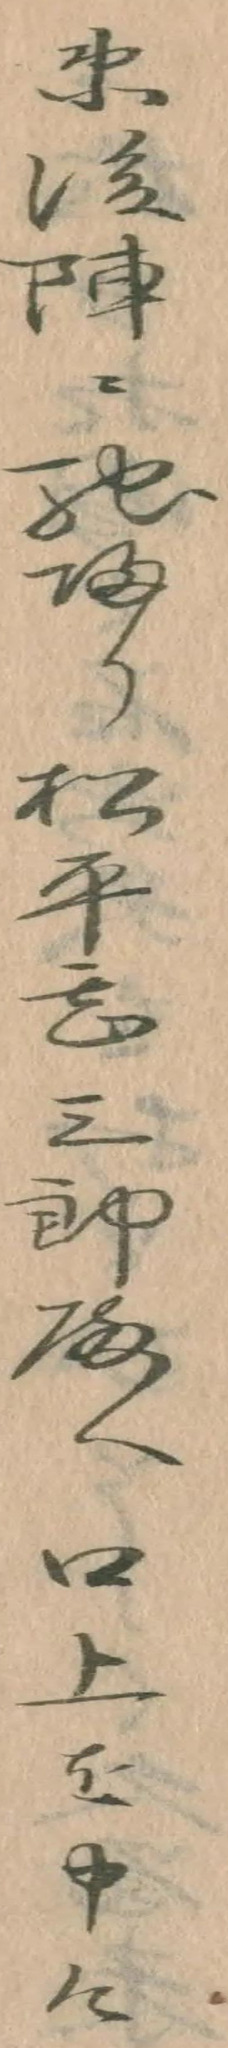衛後陣に馳帰り松平甚三郎殿へ口上を申け
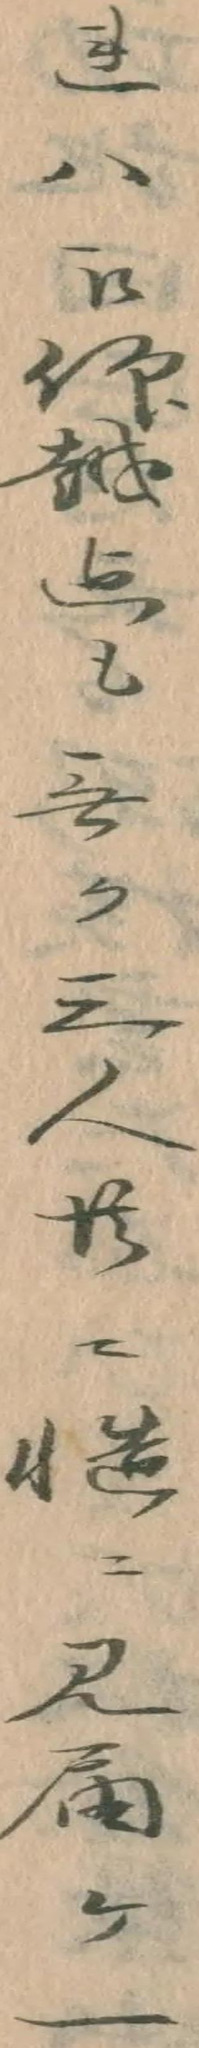連は被仰越迄も無く三人共に慥に見届け一
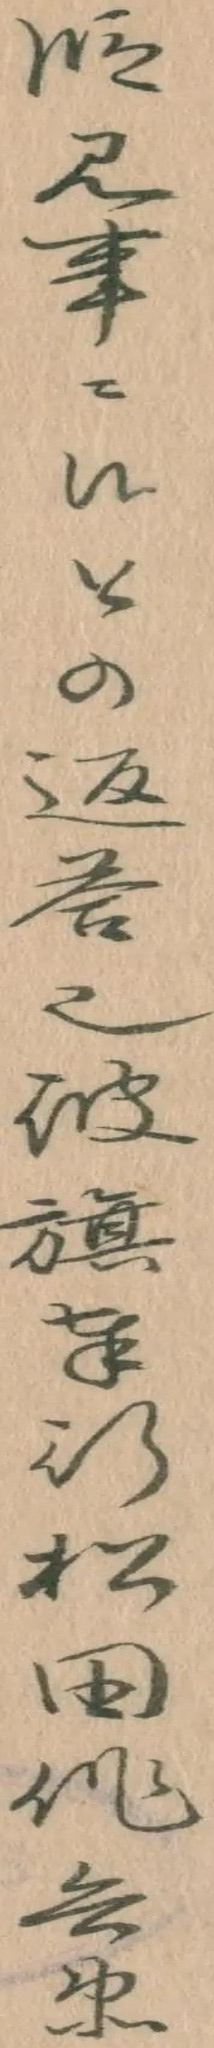段見事に候との返答也彼旗奉行松田作兵衛
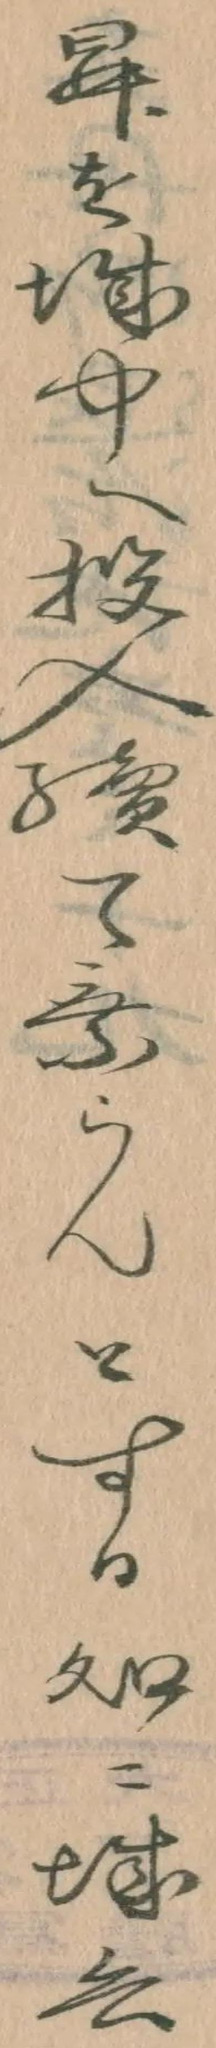昇を城中へ投入続て乗らんとする処に城兵
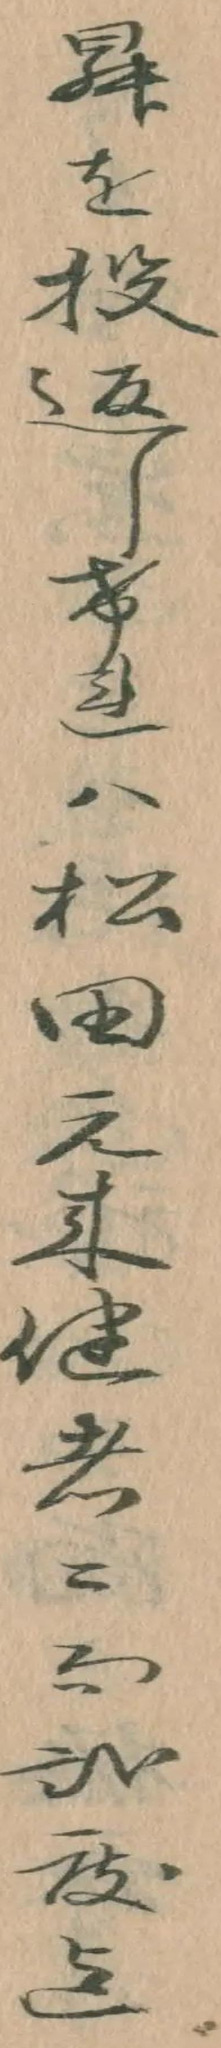昇を投返し希連は松田元来健者に而弐度迄
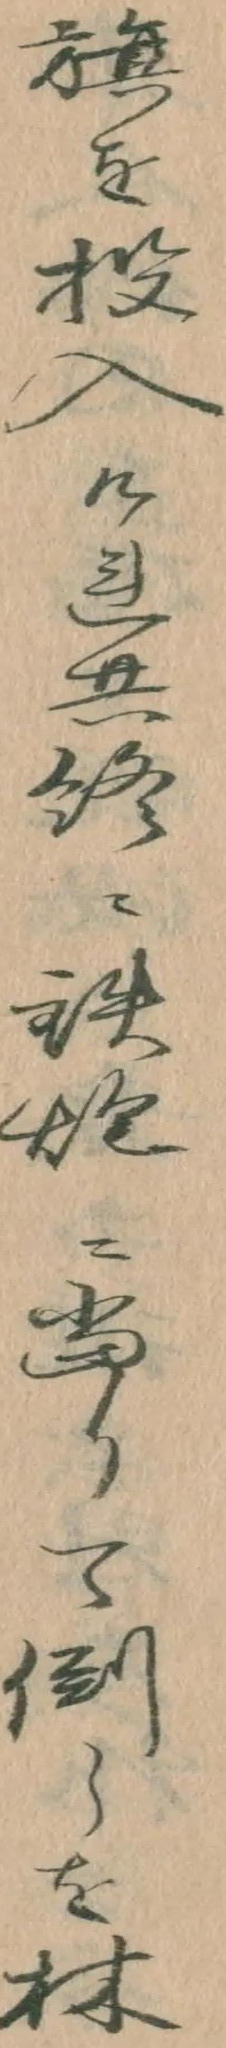旗を投入け連共終に鉄炮に当りて倒しを林
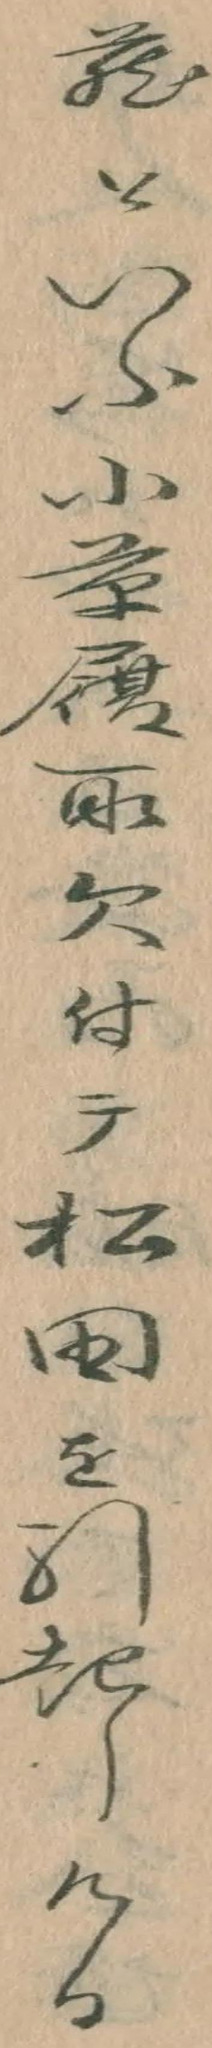蔵といふ小草履取欠付て松田を引起しける
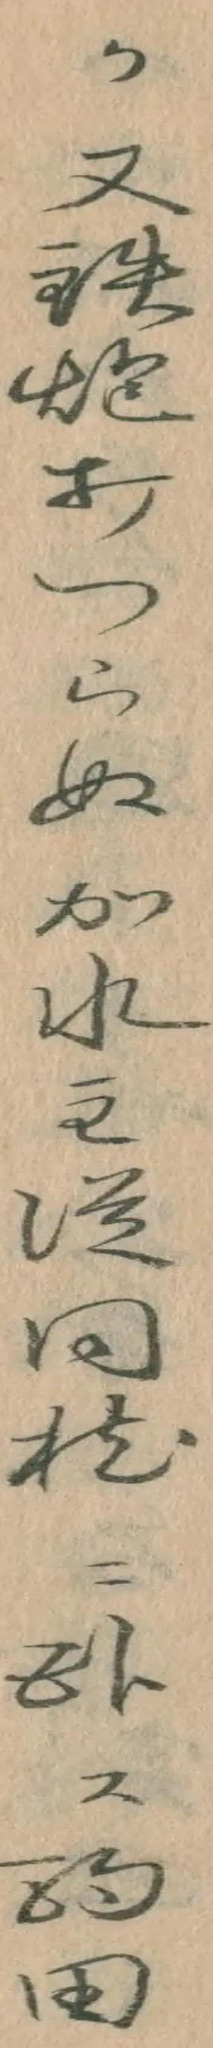か又鉄砲打つらぬ加れ主従同枕に臥す駒田
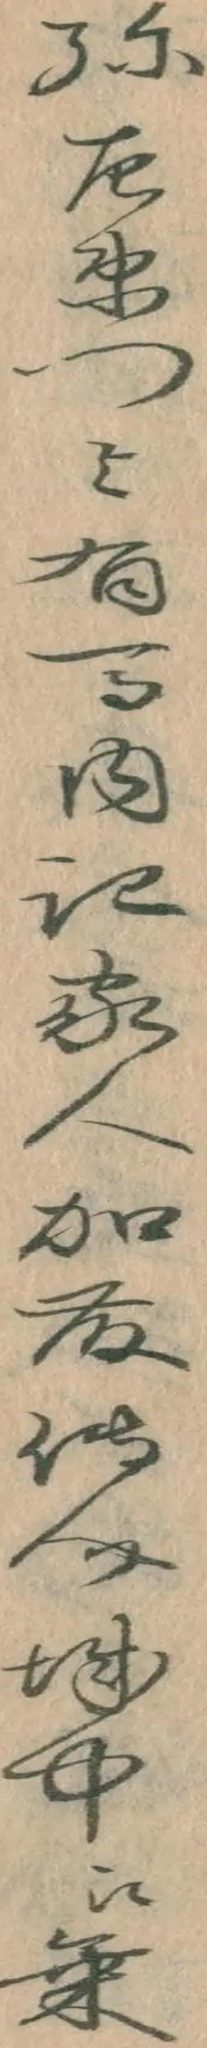弥左衛門与有馬内記家人加藤伝介城中江乗
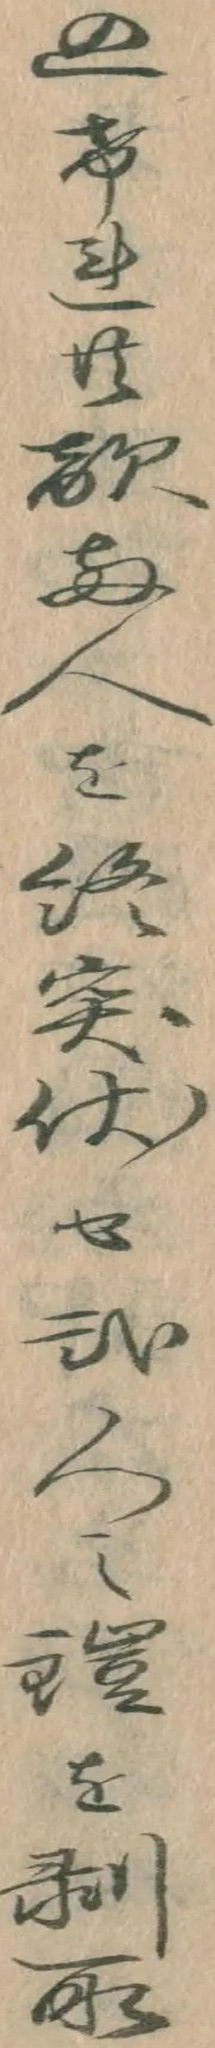込希連共敵両人を終突伏せ弐人之鎧を剥取
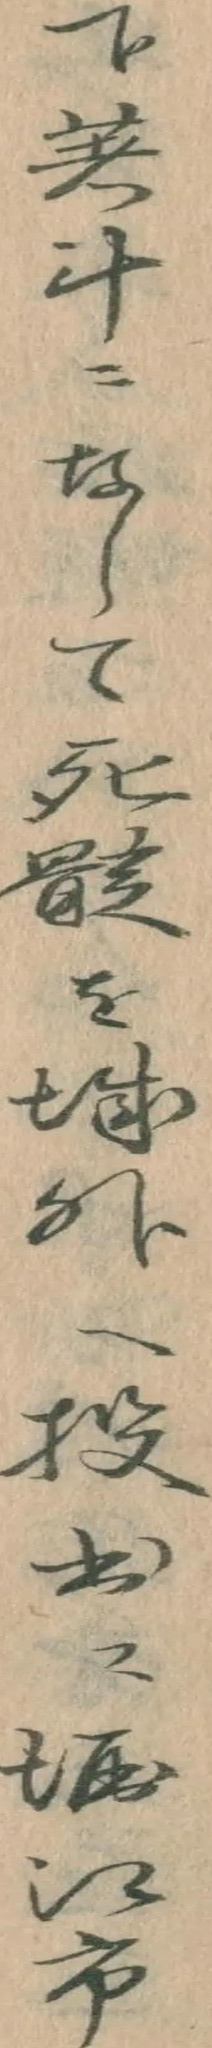下著斗になして死骸を城外へ投出す堀江市
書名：切支丹御退治記 49巻. [5]
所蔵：国立国会図書館 National Diet Library, JAPAN
